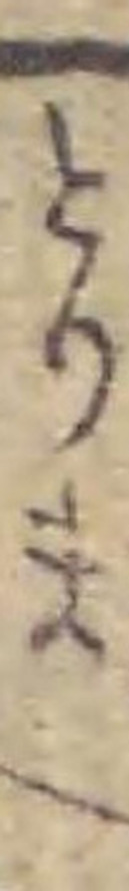とりま
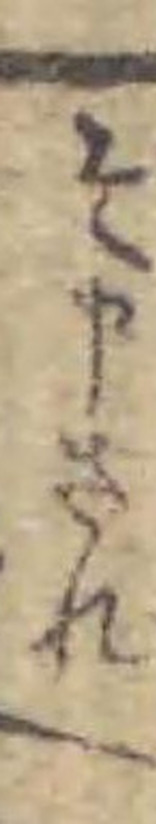そ申され
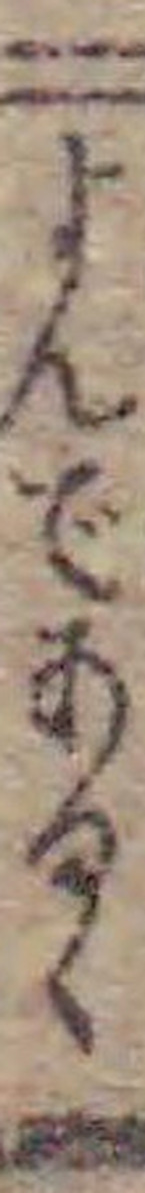よんであるく
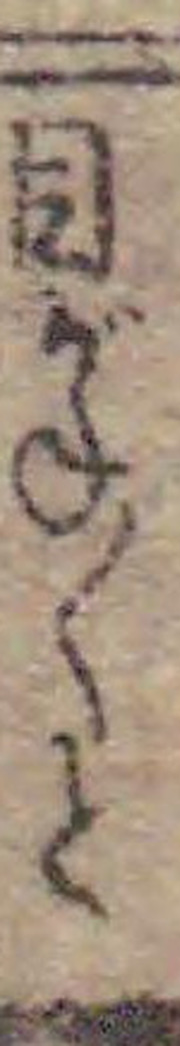目がね〳〵と
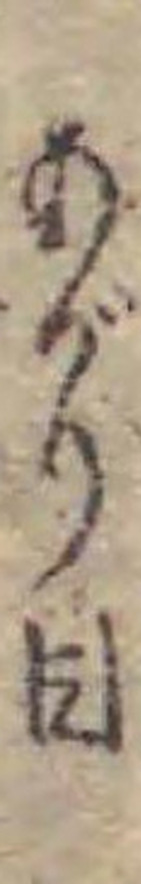あがり目
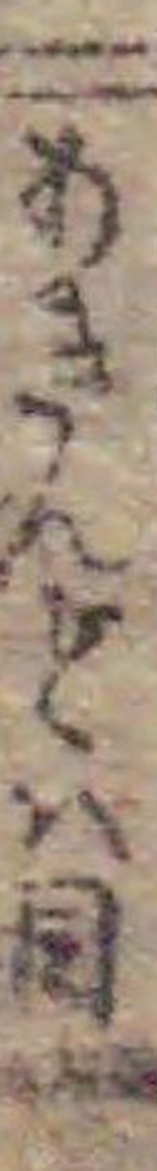あきんとは目
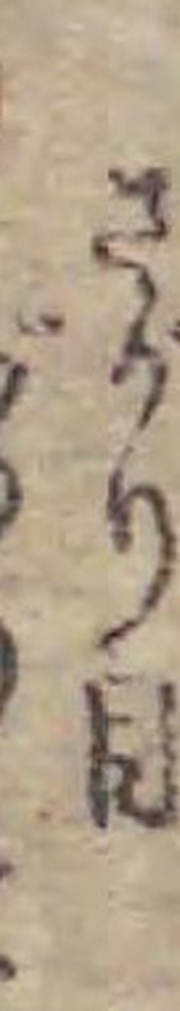さがり目
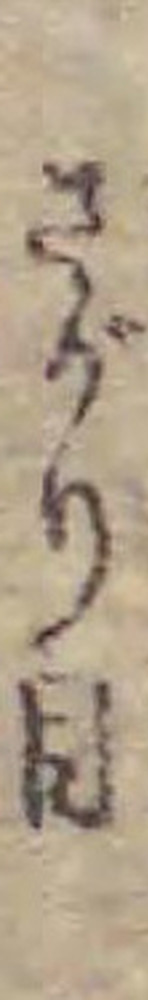さがり目
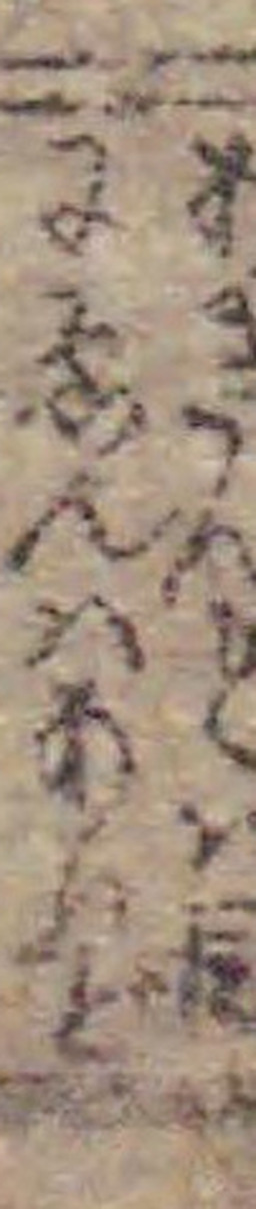にゑんはあれど
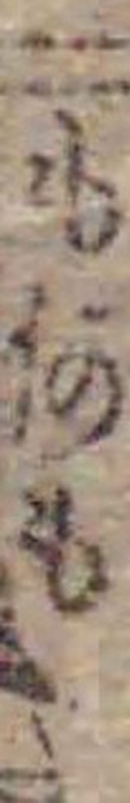も何も
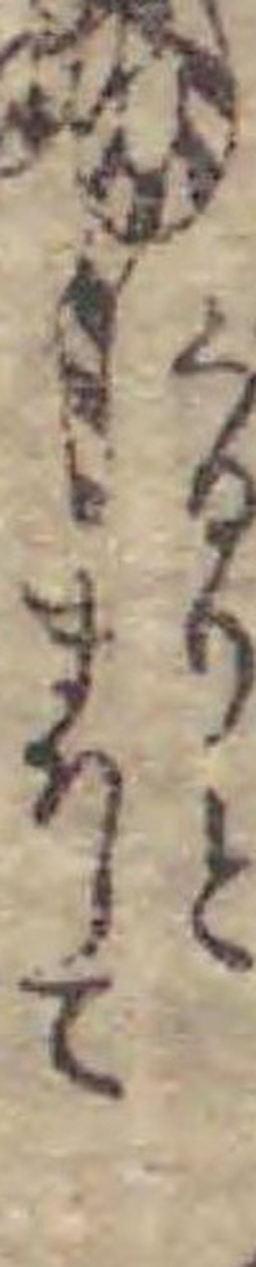まはして
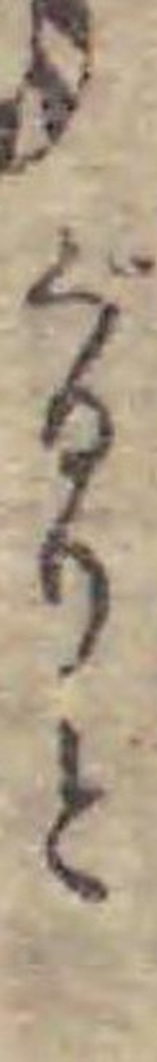ぐるりと
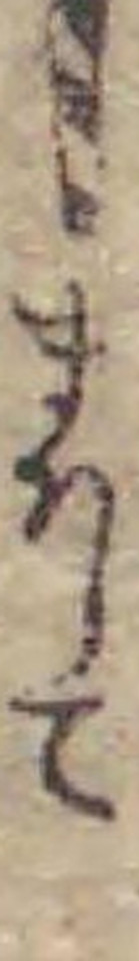まはして
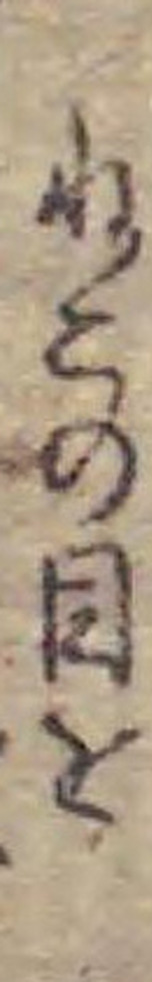ねこの目を
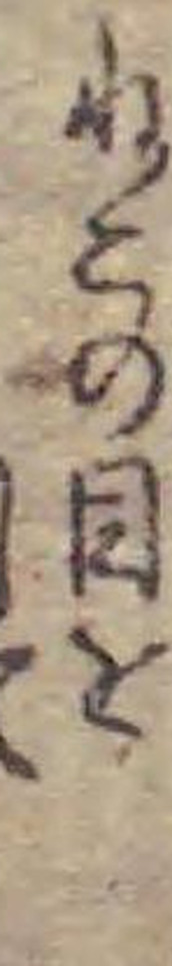ねこの目を
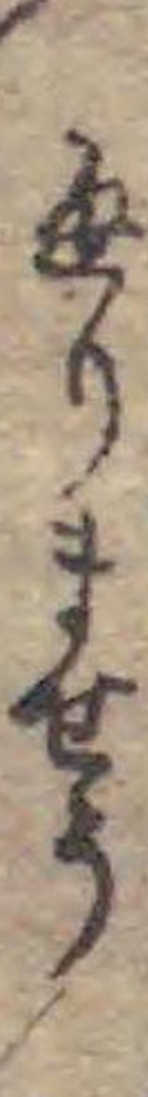通りませう
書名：悪七変目景清 : 2巻
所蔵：国立国会図書館 National Diet Library, JAPAN
